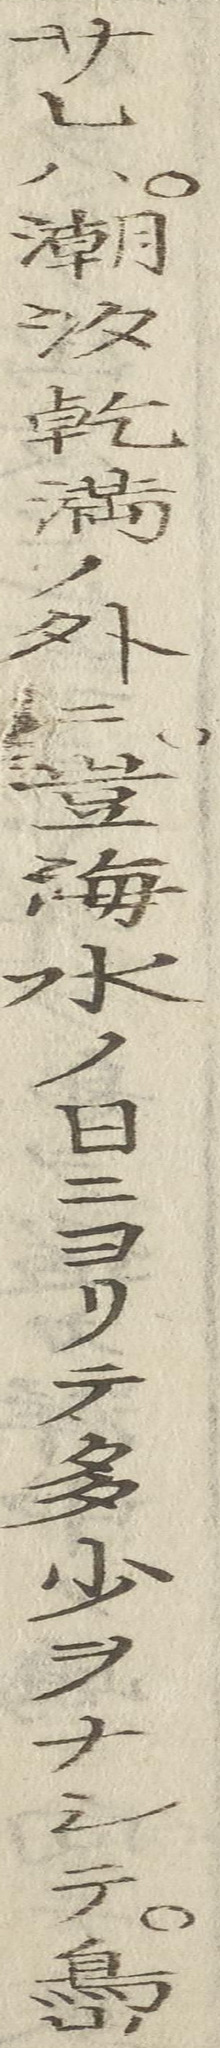サレハ。潮汐乾満ノ外ニ豈海水ノ日ニヨリテ多少ヲナシテ。嶋

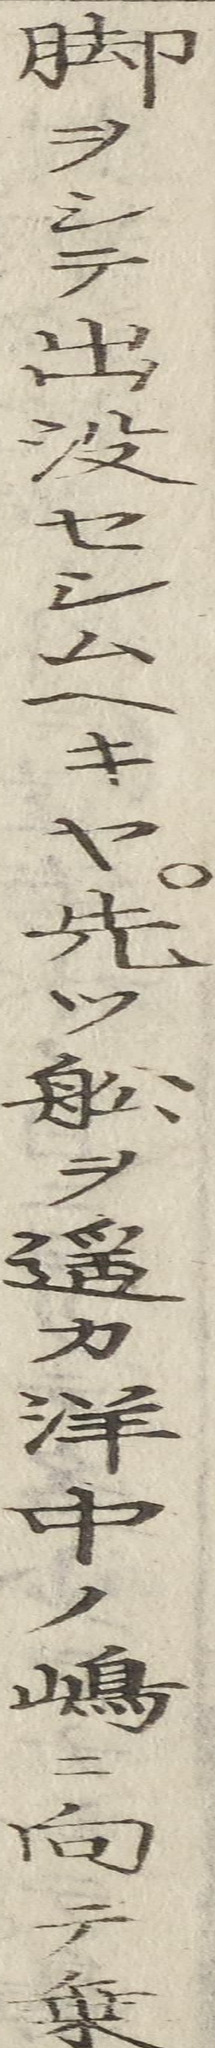脚ヲシテ出没セシムヘキヤ。先ツ舩ヲ遙カ洋中ノ嶋ニ向テ乗
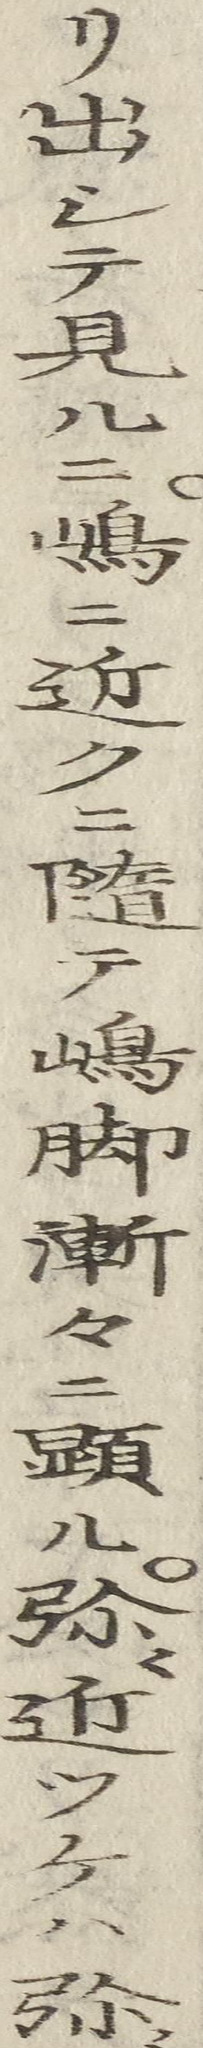リ出シテ見ルニ。嶋ニ近クニ随テ嶋脚漸々ニ顕ル。弥々近ツケハ弥々
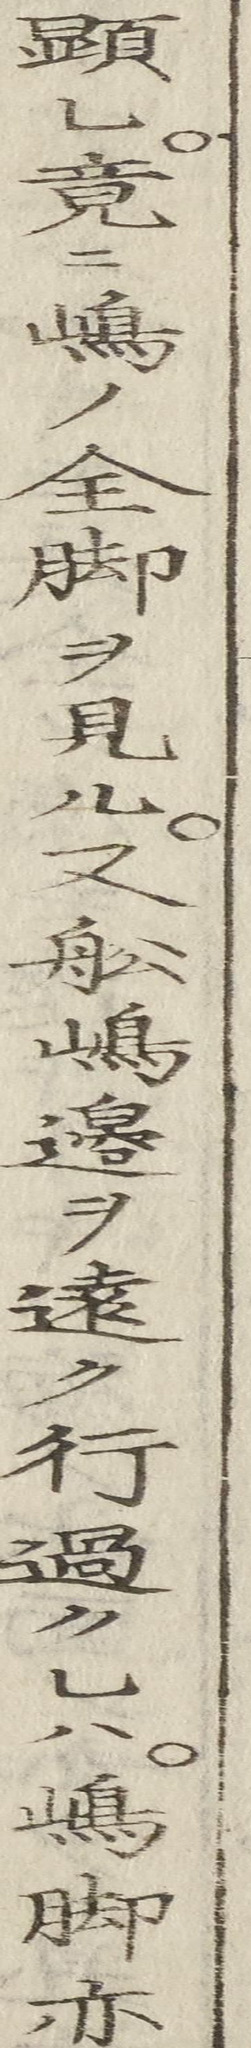顕レ。竟ニ嶋ノ全脚ヲ見ル。又舩嶋辺ヲ遠ク行過クレハ。嶋脚亦
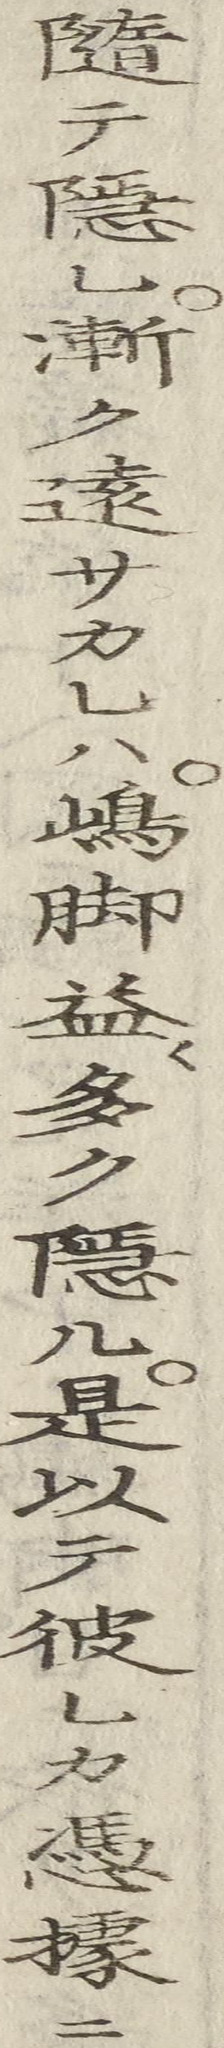随テ隠レ。漸ク遠サカレハ。嶋脚益々多ク隠ル。是以テ彼レカ憑拠ニ
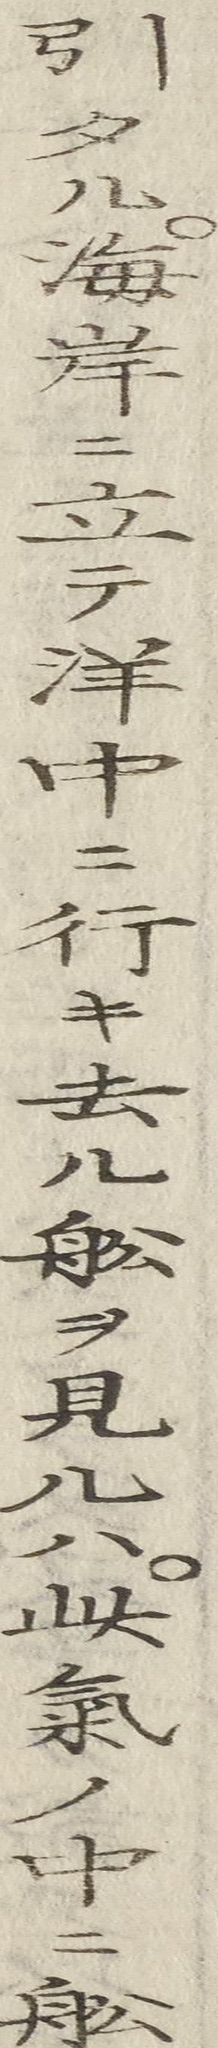引タル。海岸ニ立テ洋中ニ行キ去ル舩ヲ見ルハ。此気ノ中ニ舩
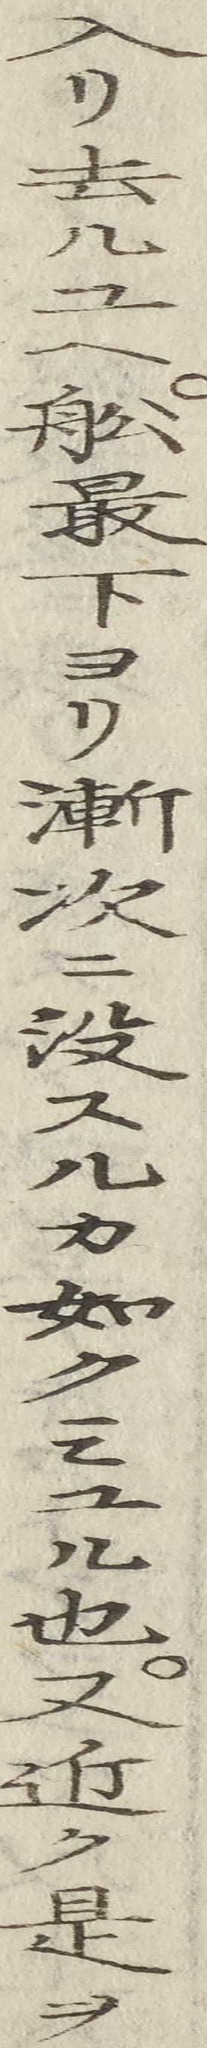入リ去ルユヘ。舩最下ヨリ漸次ニ没スルカ如クミユル也。又近ク是ヲ
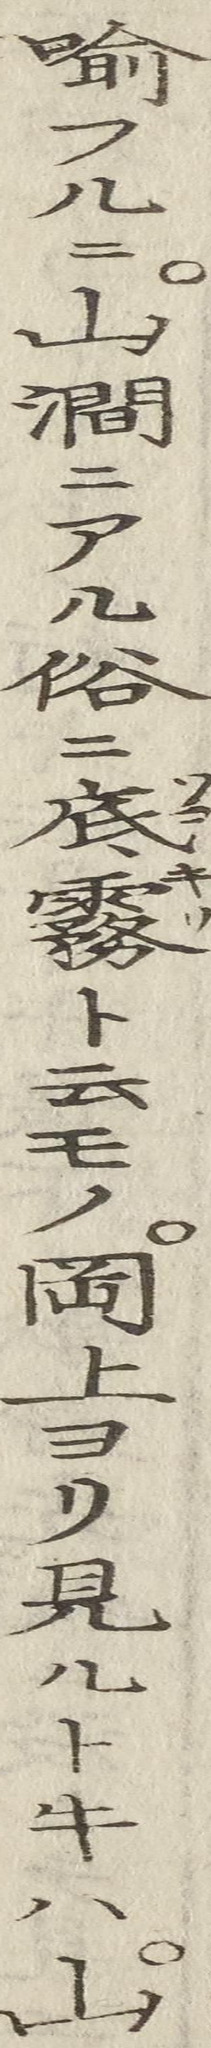喩フルニ。山澗ニアル俗ニ底霧ト云モノ。岡上ヨリ見ルトキハ。山
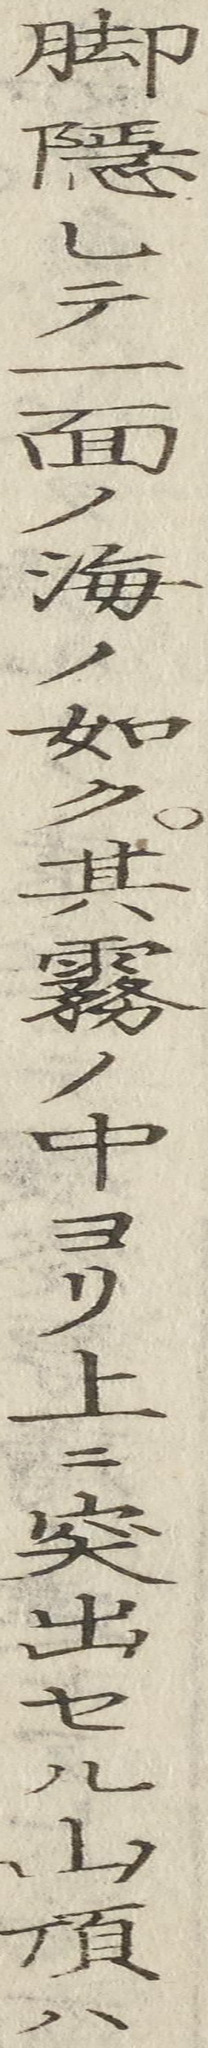脚隠レテ一面ノ海ノ如ク。其霧ノ中ヨリ上ニ突出セル山頂ハ
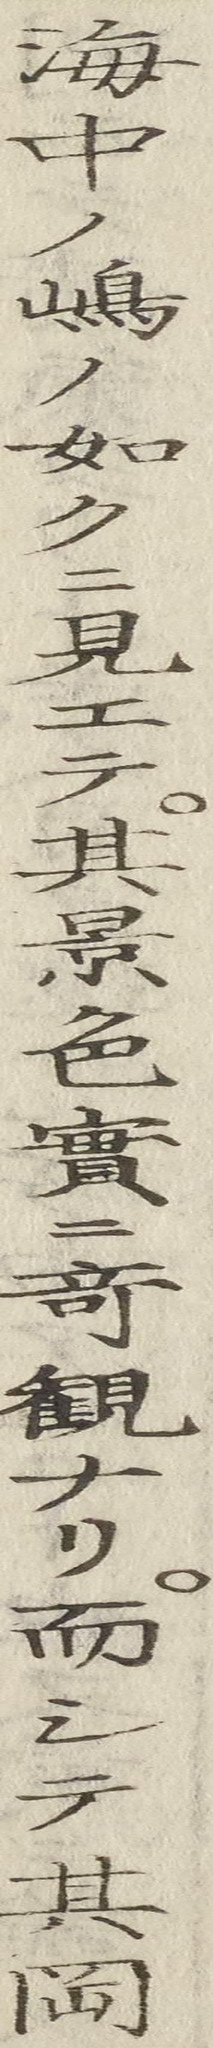海中ノ嶋ノ如クニ見エテ。其景色実ニ奇観ナリ。而シテ其岡
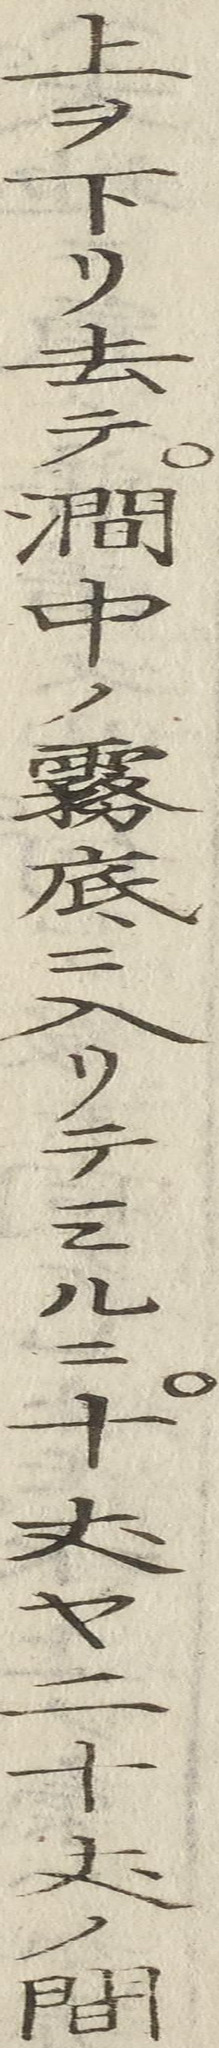上ヲ下リ去テ。澗中ノ霧底ニ入リテミルニ。十丈ヤ二十丈ノ間
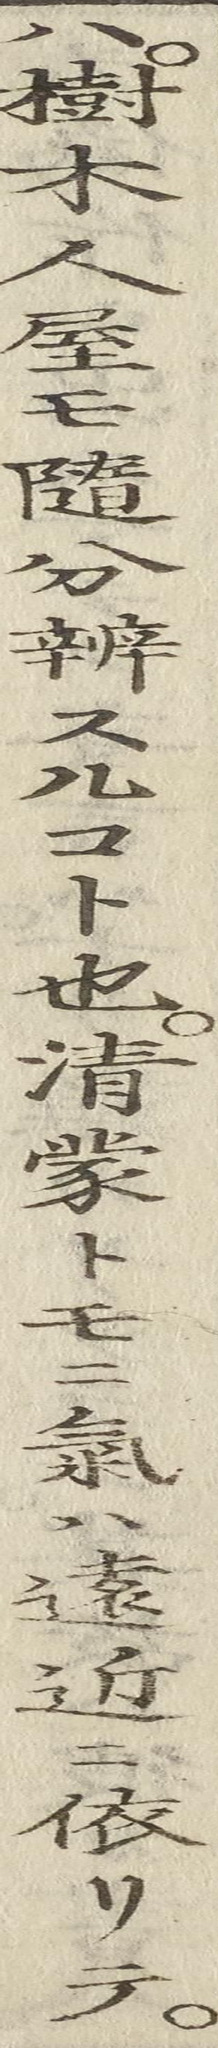ハ。樹木人屋モ随分弁スルコト也。清蒙トモニ気ハ遠近ニ依リテ。
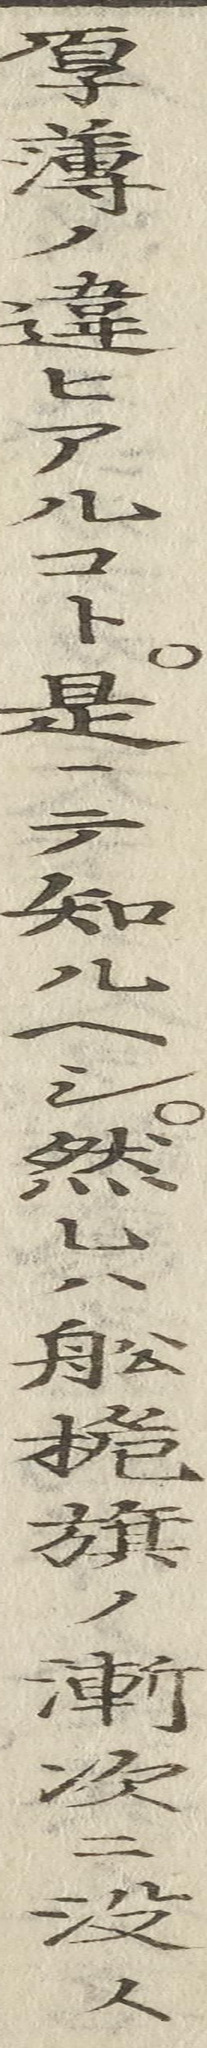厚薄ノ違ヒアルコト。是ニテ知ルヘシ。然レハ舩桅旗ノ漸次ニ没ス
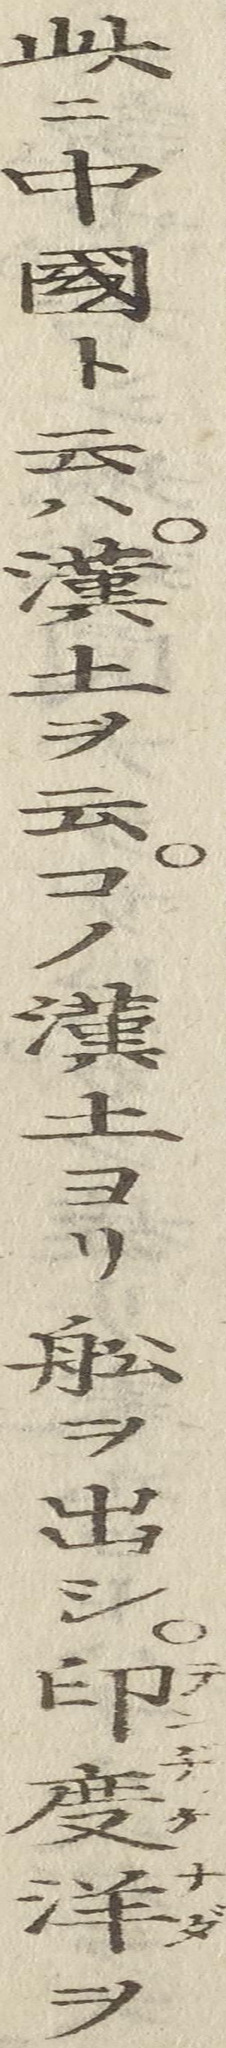此ニ中国ト云ハ。漢土ヲ云。コノ漢土ヨリ舩ヲ出シ。印度洋ヲ
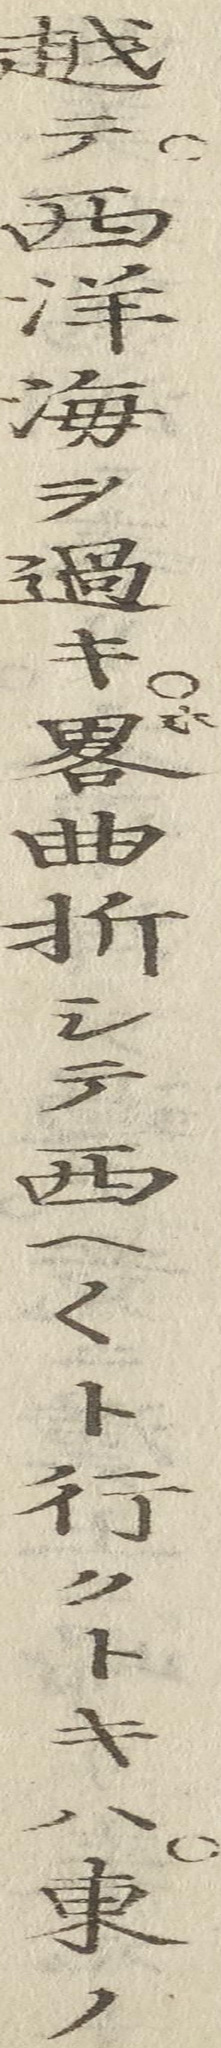越テ。西洋海ヲ過キ。略曲折シテ西へ〳〵ト行クトキハ。東ノ

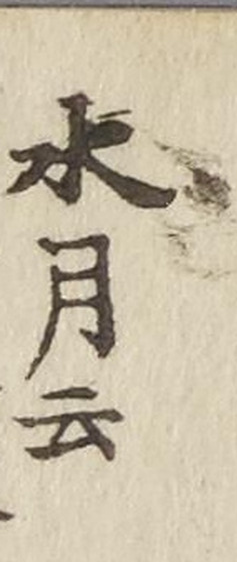水月云
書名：護法新論　中
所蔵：東京大学地震研究所図書室 Earthquake Research Institute Library, The University of Tokyo, JAPAN
